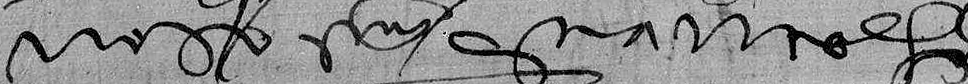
noso sn̄or / e sua molher
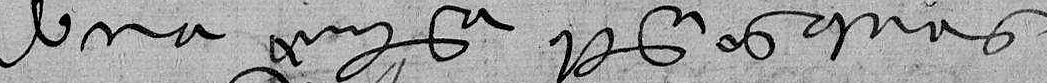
dona amta ꝯtra os quaes
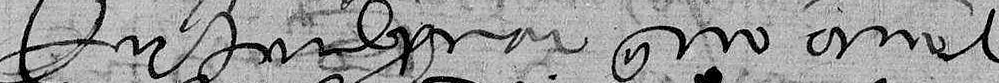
Entendo ꝓuar q̄ no an̄o de
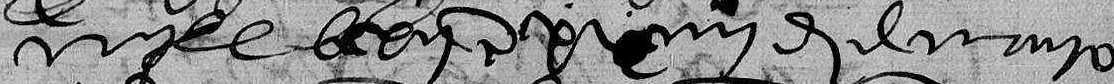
mjll bcxij ē primo dj de mayo
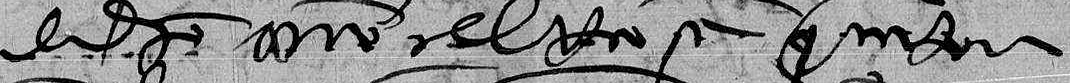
do dtō anō ell Reo se ꝯcertou
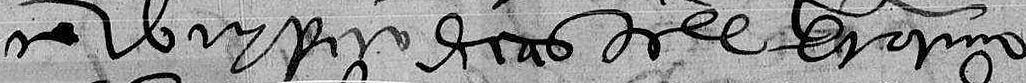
cō dom pero de castell branco
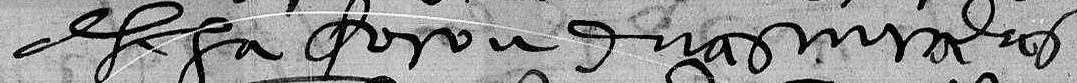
e lhe haforou duas moradas
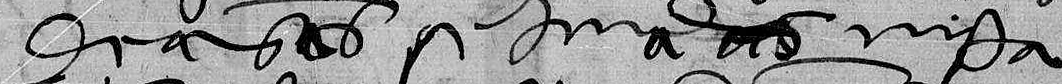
de casas setuadas nesta
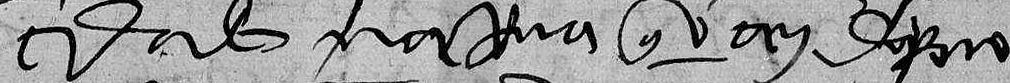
cidade na Rua q̄ vay do poço
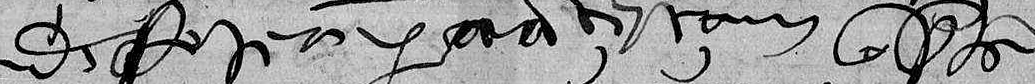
de fotea ꝑa a cōceiçam q̄ p̄tē
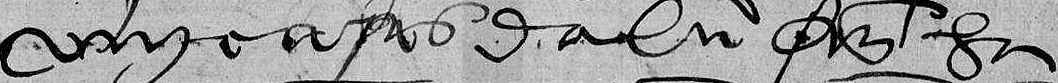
com casas daluo frz̄ ha
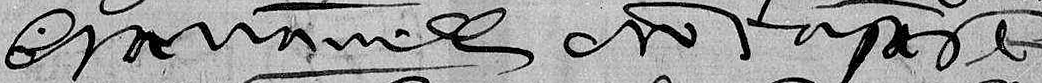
brauanell e cō casas de
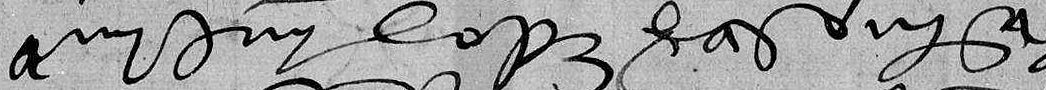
amtam lopez e as outas ꝯ
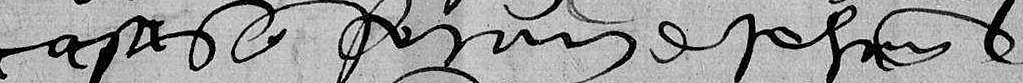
casas q̄ foram de Joham
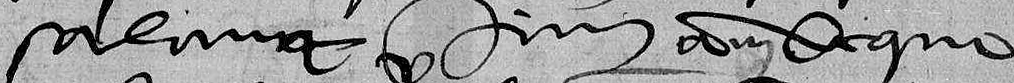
salama p̄tem com bequo
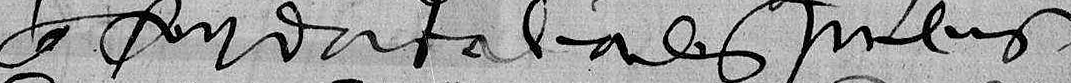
q̄ foy da cadea dos Judeus
